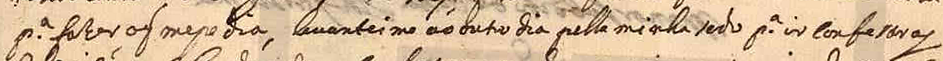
p.a fazer o q̄ me pedia, leuantei me ao outro dia pella minha sedo p.a ir confesar as
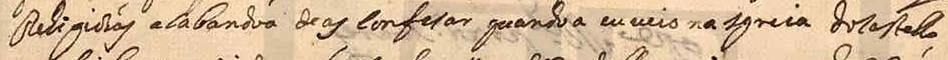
Religiozas acabandoa de as confesar quando a eu ueio na Igreia do Castello
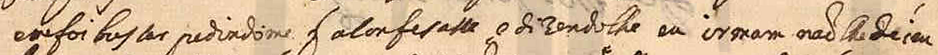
e me foi buscar pedindome q̄ a Confesasse, e dizendolhe eu irmam naõ lhe dei eu
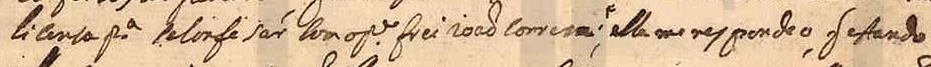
licensa p.a se Confesar Com o p.e frei Ioaõ Correia? ella me respondeo q̄ estando
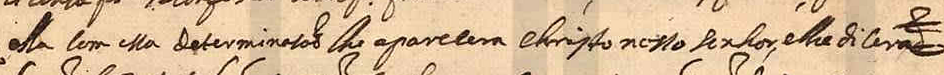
ella com essa determinaçaõ lhe aparecera christo nosso senhor, e lhe diCeraõ
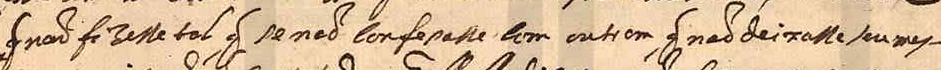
q̄ naõ fizesse tal q̄ se naõ Confessasse com outrem, q̄ naõ deixasse seu mes
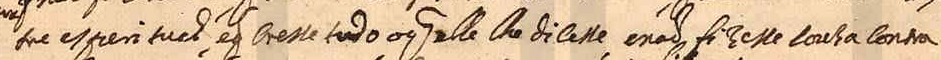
tre esperitual, e q̄ Cresse tudo o q̄ elle lhe dicesse, e naõ fizesse couza contra
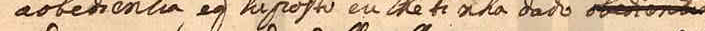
a obediencia, e q̄ suposto eu lhe tinha dado obediencia
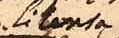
licensa
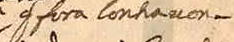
q̄ fora contra uon
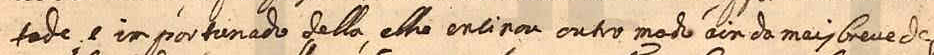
tade, e importunado della, e lhe encinou outro modo ainda mais breue de
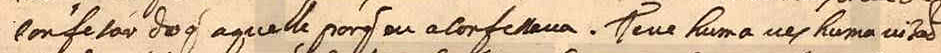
confesar do q̄ aquelle por q̄ eu a confessaua. Teue huma ues huma uizaõ
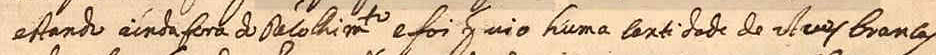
estando ainda fora do Recolhimto, e foi q̄ uio huma cantidade de Aues brancas
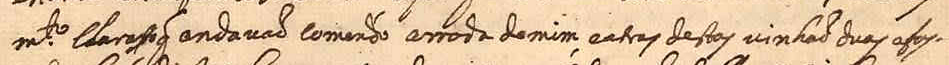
m.to Claras q̄ andauaõ comendo a rroda de mim, e atras destas uinhaõ duas afas
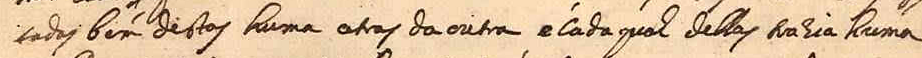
tadas bem distas huma atras da outra e cada qual dellas trazia huma
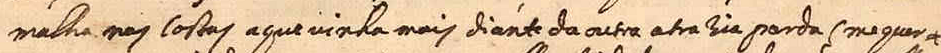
malha nas costas a que uinha mais diante da outra a trazia parda (me quer
